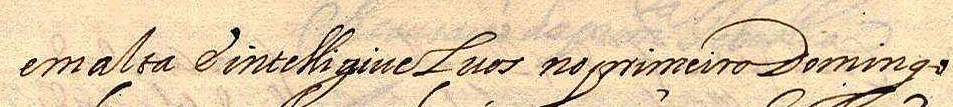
em alta e intelligiuel uos no primeiro Domingo
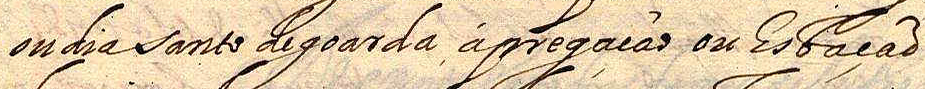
ou dia santo de goarda á pregaçaõ ou Estaçaõ
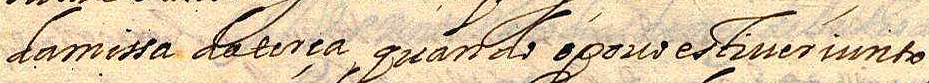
da missa da terça, quando o pouo estiuer iunto
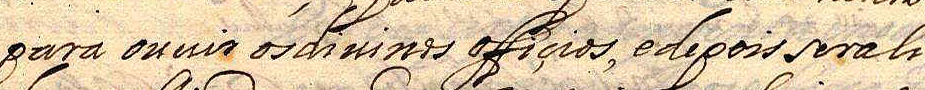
para ouuir os diuinos officios, e depois sera li
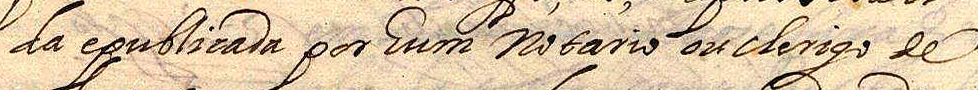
da e publicada por hum notario ou clerigo de
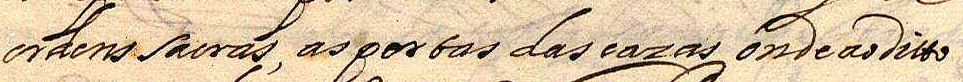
ordens sacras, as portas das cazas onde ao ditto
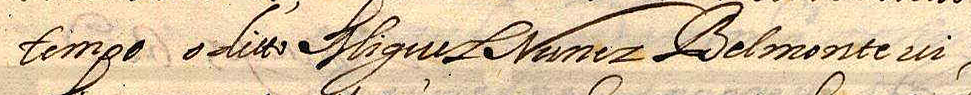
tempo o ditto Miguel Nunez Belmonte ui
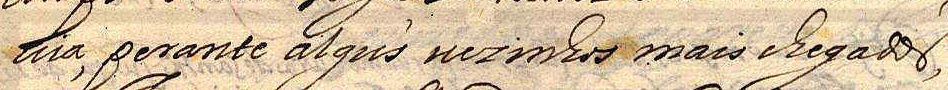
uia, perante algūs uezinhos mais chegados,
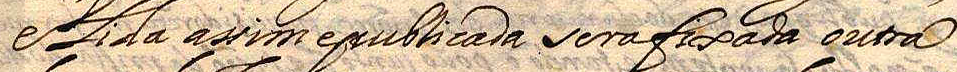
e Lida, assim e publicada sera fixada outra
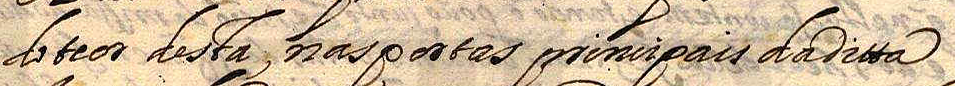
do teor desta, nas portas principais da ditta
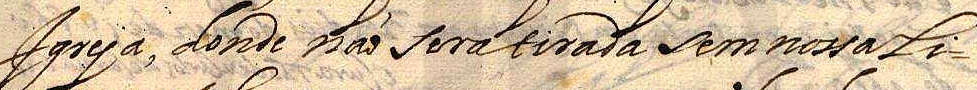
Jgreja, donde não sera tirada sem nossa Li
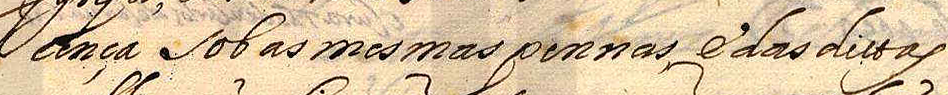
cença sob as mesmas pennas, e das dittas
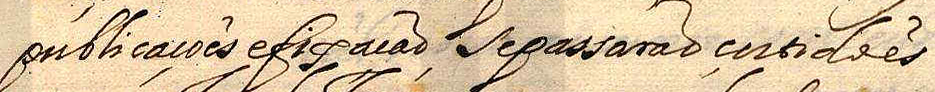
publicações e fixação se passaraõ çertidoẽs
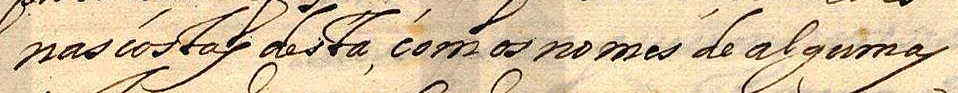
nas costas desta, com os nomes de algumas
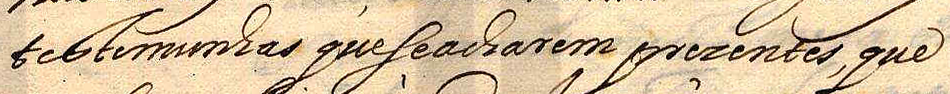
testemunhas que se acharem prezentes, que
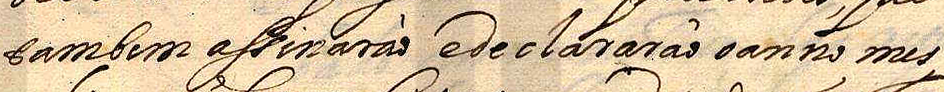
tambem assinaraõ, e declararaõ o anno, mes
